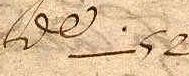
Jde. 52
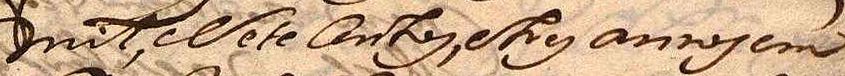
mil, e SeteCentos, e tres annos em
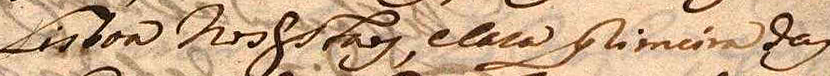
Lisboa nos estaos, e caza primeira das
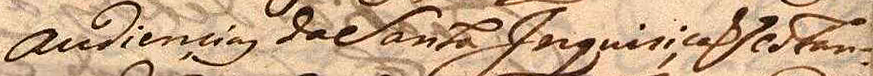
audiençias da Santa Jnquisiçaõ estan
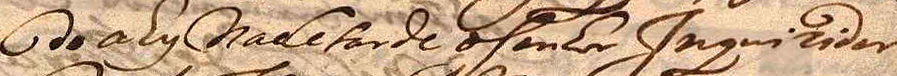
do ahy na de tarde o senhor Jnquizidor
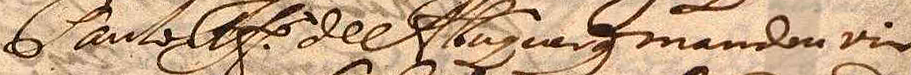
Paulo Aff.o de Albuquerq̄ mandou vir
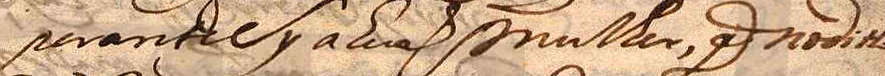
perante Sy a huā mulher, q̄ no ditto
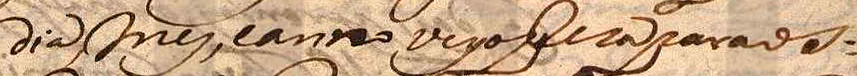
dia, mes, e anno o veyo preza para os
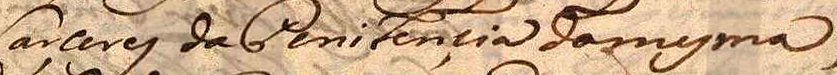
Carçeres da Penitençia da mesma,
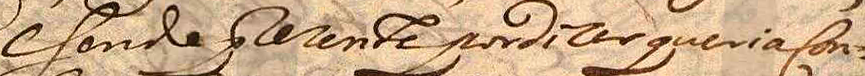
e sendo prezente por dizer queria Con
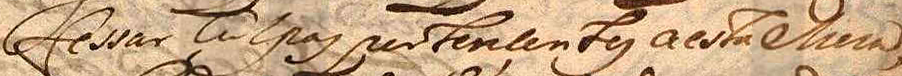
fessar culpas pertençentes a esta Mesa,
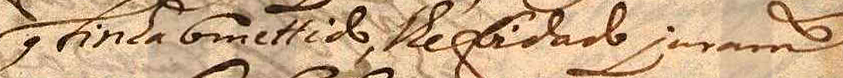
q̄ tinha comettido, lhe foi dado juramto.
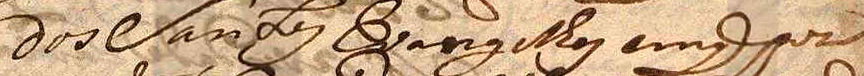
dos Santos Evangelhos em q̄ poz
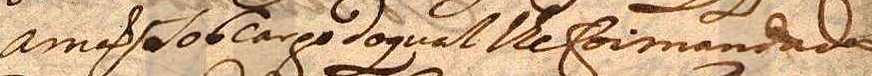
a maõ sob cargo do qual lhe foi mandado
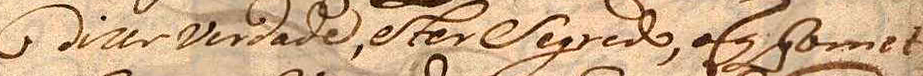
dizer verdade, e ter Segredo, o q̄ promet
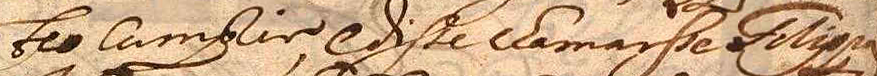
teo cumprir, e disse chamarsse Felippa
